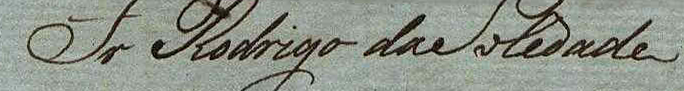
Fr Rodrigo da Soledade
